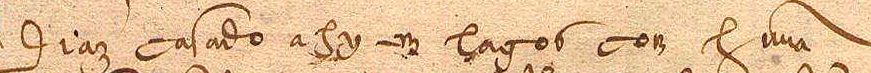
d̄iaz casado asy em lagos com hūua
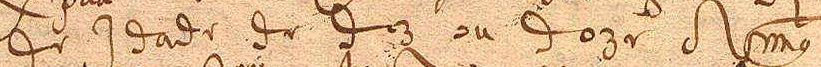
de Jdade de dez ou doze An̄nꝯ
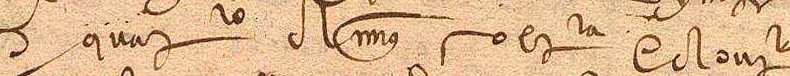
e quatro An̄nꝯ soltra e A outra
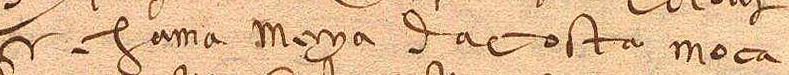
se chama Merya da costa moça
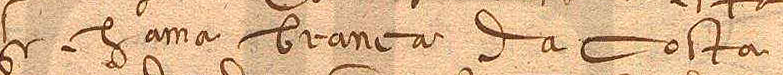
se chama branca da Costa
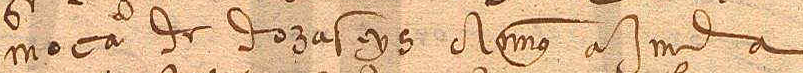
moça de dozaseys An̄nꝯ aJmda
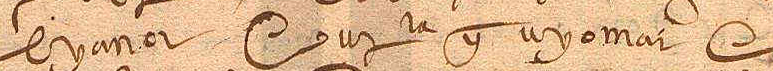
lyanor e outra guyomar e
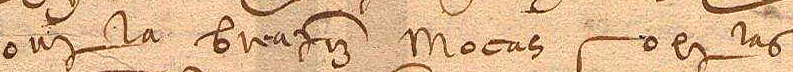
outra breat̄iz moças soltras
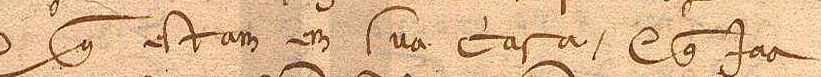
e q̄ estam em sua casa / e q̄ Jaa
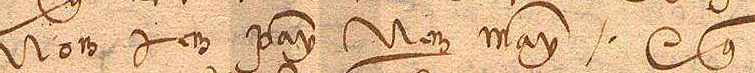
Nom tem pāy Nem māy /. e q̄
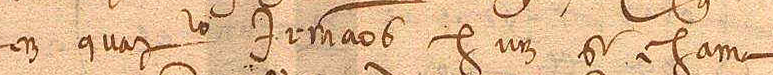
tem quatro Jrmãos hum se chama
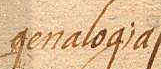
genalogia
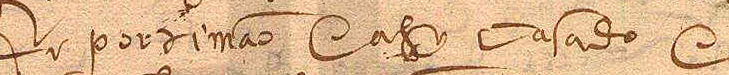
de portimão e ahy casado e
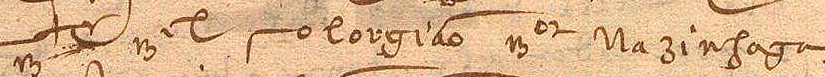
mte mel solorgião mor nazinhaga
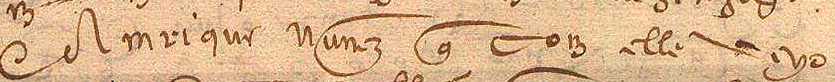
e Amrique Nūnez q̄ com elle veyo
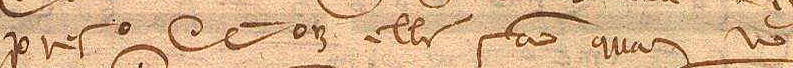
preso e com elle são quatro
